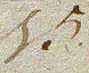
15
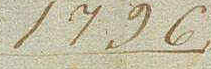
1796
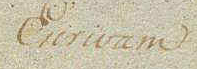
Escrivam
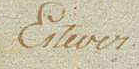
Esteves
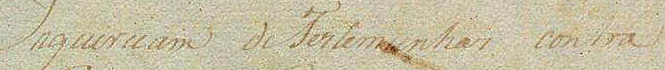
Inquiriçam de Testemunhas contra
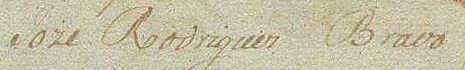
Ioze Rodriguez Bravo
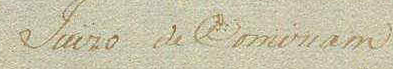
Iuizo de Comissam
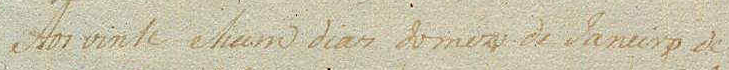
Aos vinte e hum dias do mez de Ianeiro de
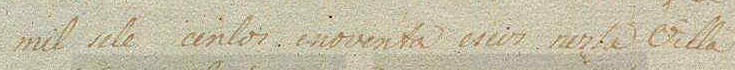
mil setecentos e noventa e seiz nesta Villa
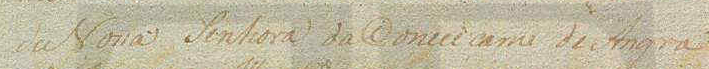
de Nossa Senhora da Conceiçam de Angra
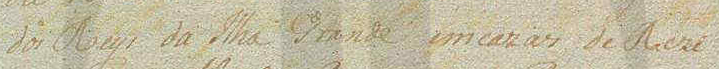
dos Reys da Ilha Grande em cazas de Rezi
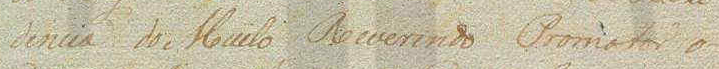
dencia do Muito Reverendo Promotor o
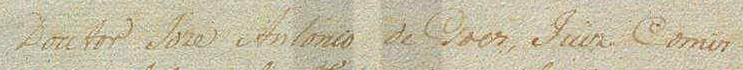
Doutor Ioze Antonio de Goes, Iuiz Comis
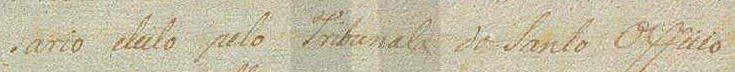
sario eleito pelo Tribunal do santo Officio
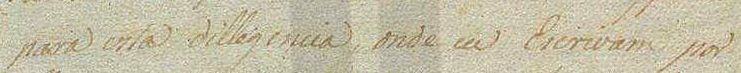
para esta dilligencia, onde eu Escrivam por
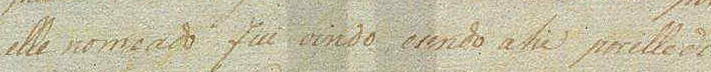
elle nomeado fui vindo e sendo ahi por elle di
